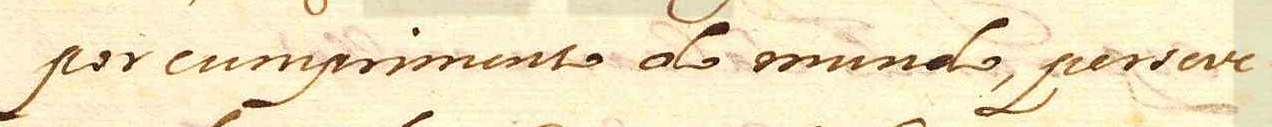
por cumprimento do mundo, perseve
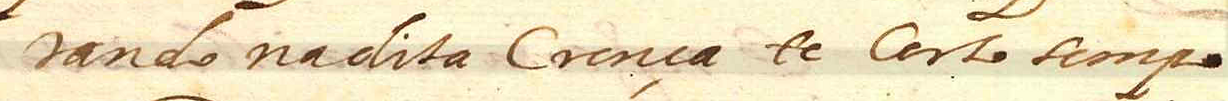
rando na dita Crença te certo tempo
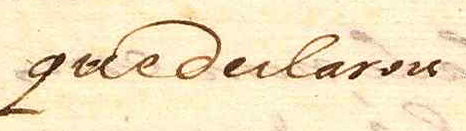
que declarou.
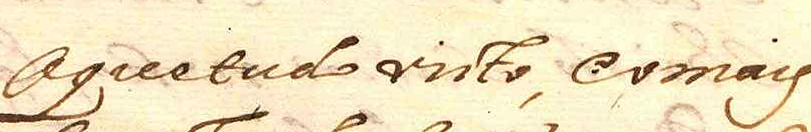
O que tudo visto, e o mais
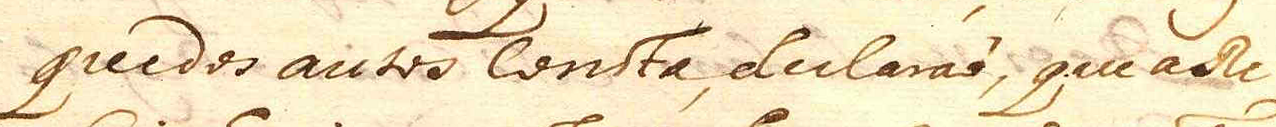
que dos autos Consta, declaraõ, que a Re
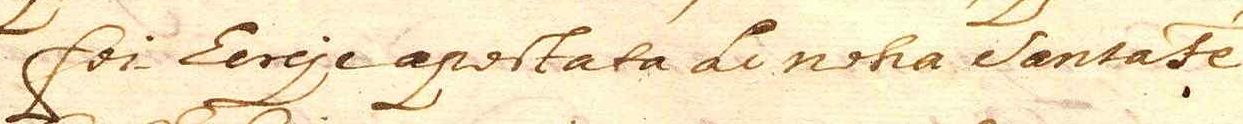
foi hereje apostata de nossa santa Fe
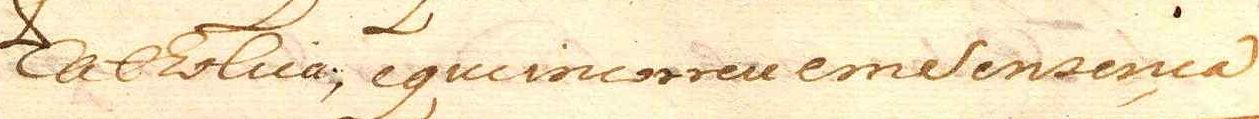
Catholica; e que incorreu em sentença
